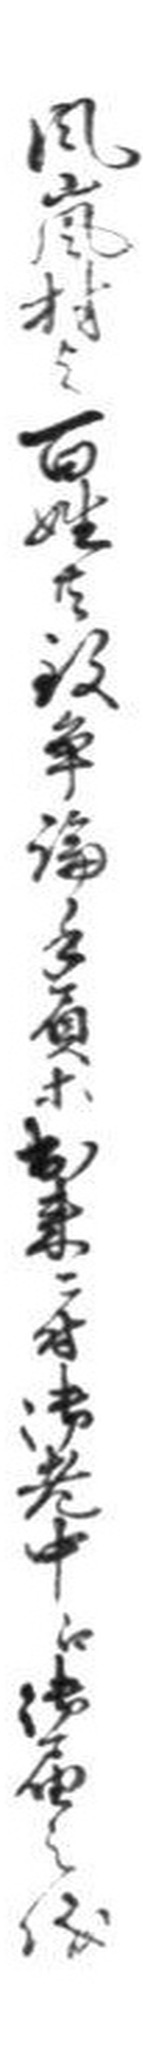風嵐村与百姓共致争論手負等出来ニ付御老中江御届之儀
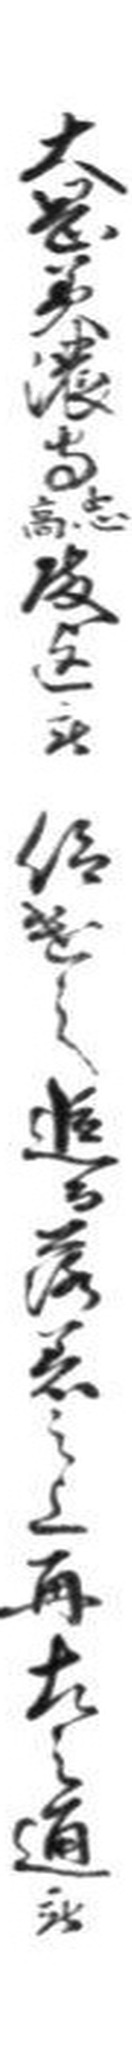大岡美濃守忠高殿迄被仰遣之追而落着之上再左之通被
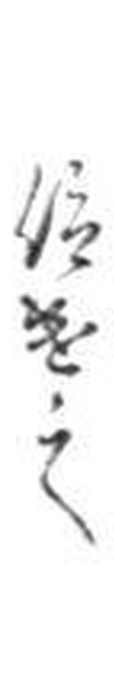仰遣之
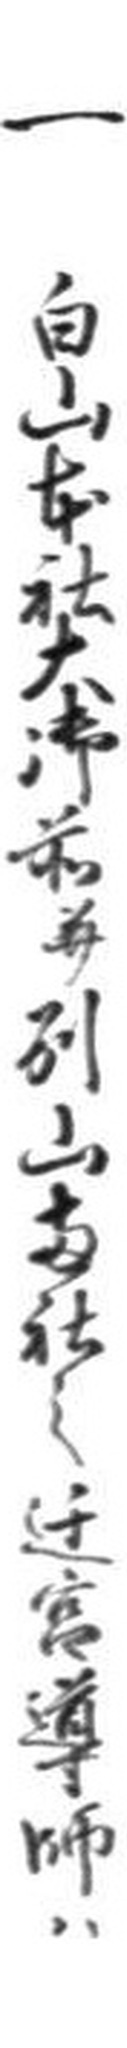一白山本社大御前并別山両社之遷宮導師ハ
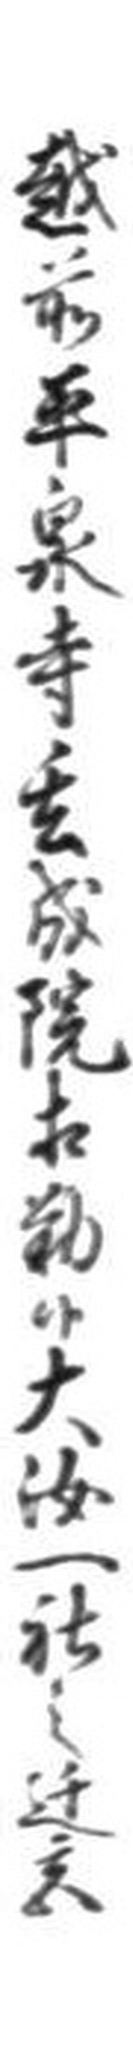越前平泉寺玄成院相勤候大汝一社之遷宮
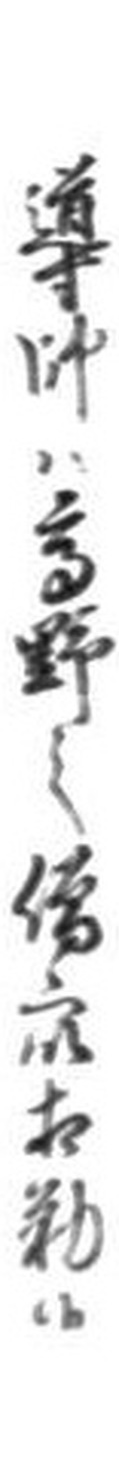導師ハ高野之僧衆相勤候
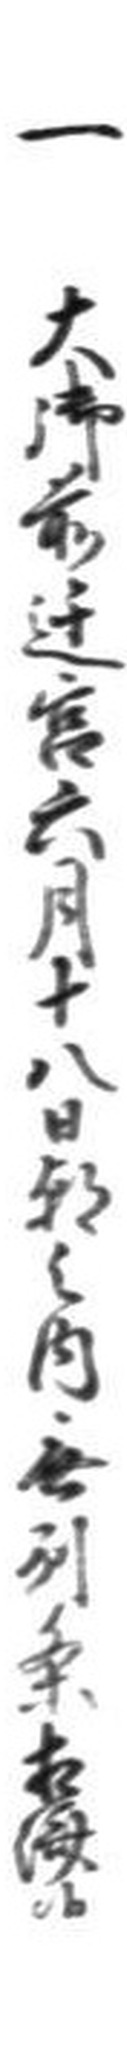一大御前遷宮六月十八日朝之内無別条相済候
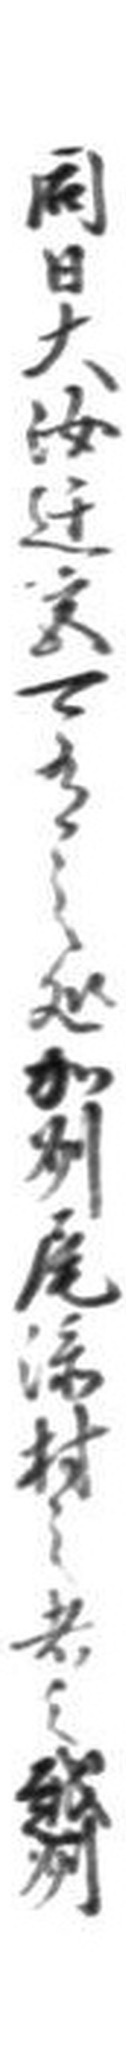同日大汝遷宮可有之処加州尾添村之者越州
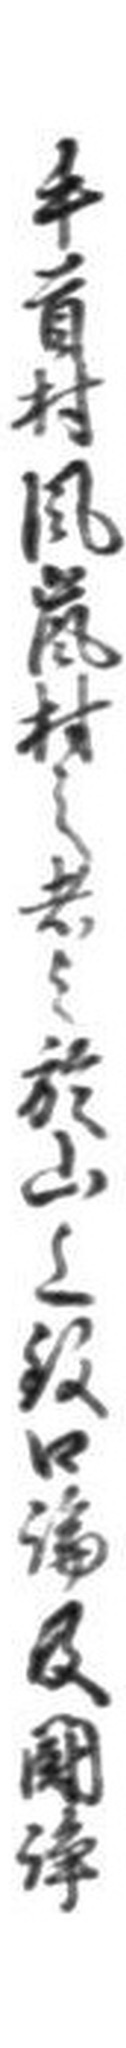牛首村風嵐村之者与於山上致口論及闘諍
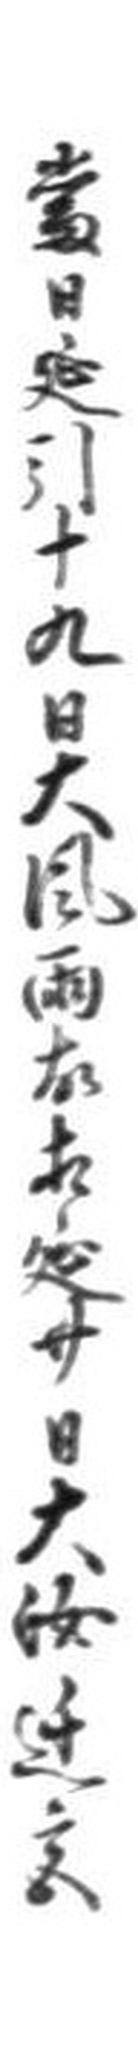当日延引十九日大風雨故相延廿日大汝遷宮
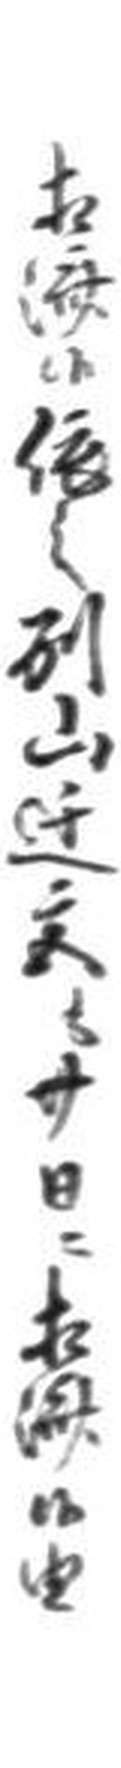相済候依之別山遷宮も廿日ニ相済候由

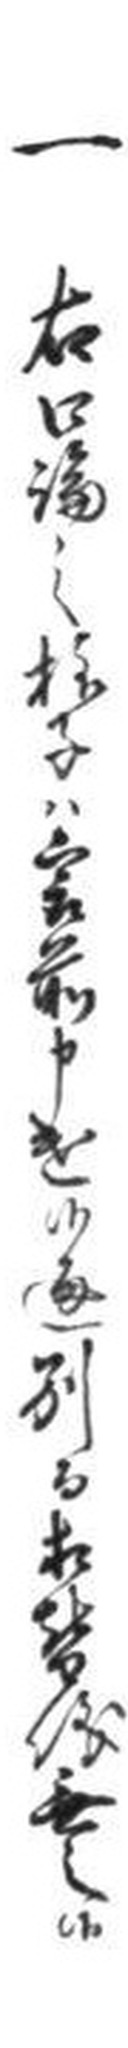一右口論之様子ハ最前申遣候通別而相替儀無之候
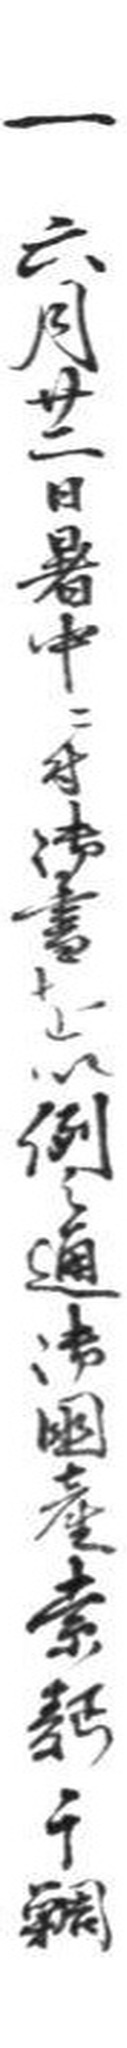一六月廿二日暑中ニ付御書を以例之通御国産素麵干鯛
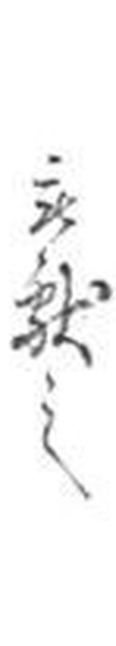被献之
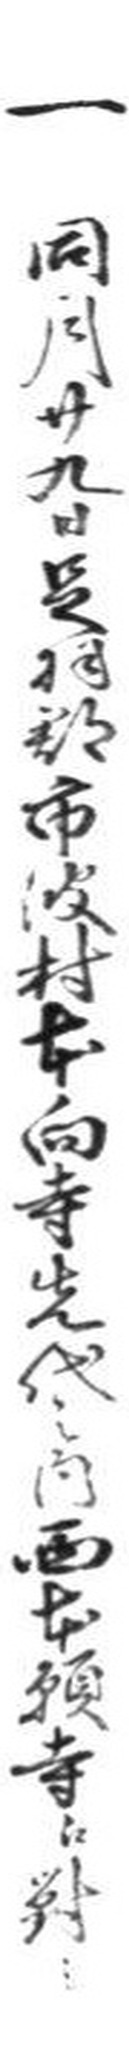一同月廿九日足羽郡市波村本向寺先代之内西本願寺江対シ
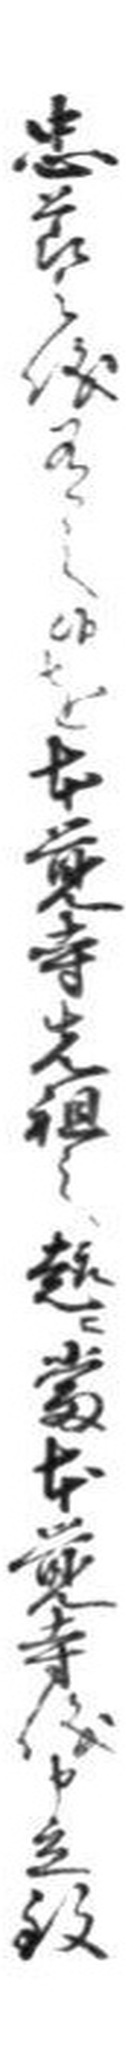忠節之儀有之候を本覚寺先祖之趣ニ当本覚寺儀申立致
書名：家譜 二十一 吉品公 従元禄十三年到同十四年
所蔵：福井県文書館 Fukui Prefectural Archives
